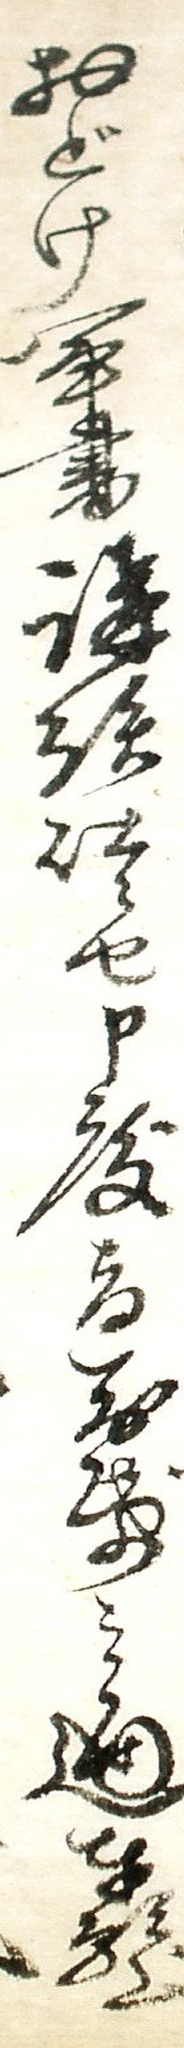おどけ軍書講談仕らせ申度旨別帋之通奉願上
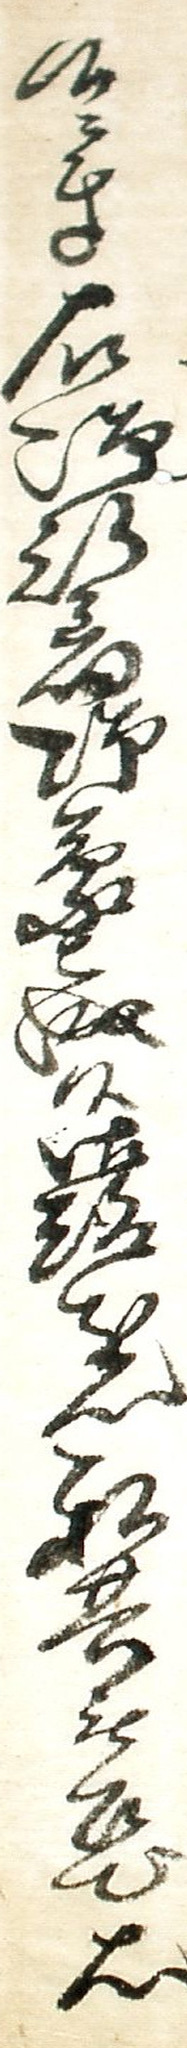候ニ付右御行着御蒙被成候御趣を以私共被召出右
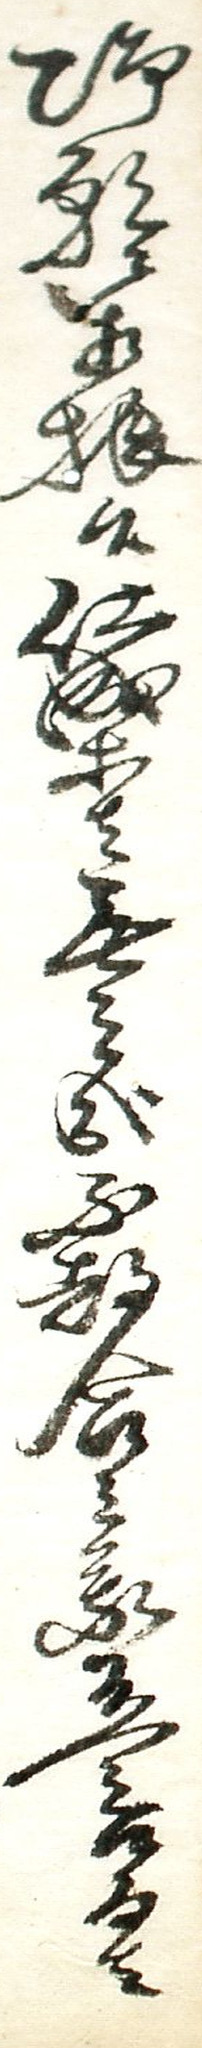御願ニ相振候仕成等者無之哉不都合之義有之候而者
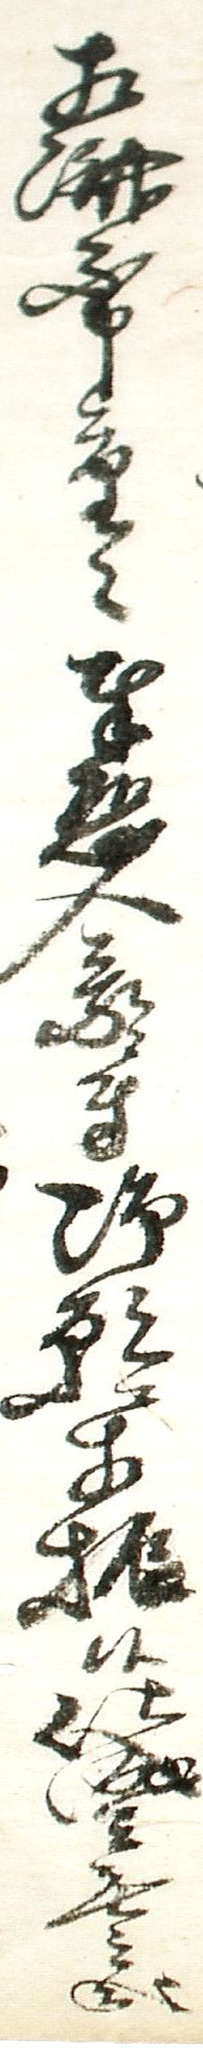相済不申重々奉恐入義ニ付御願ニ相振候仕成者無之哉
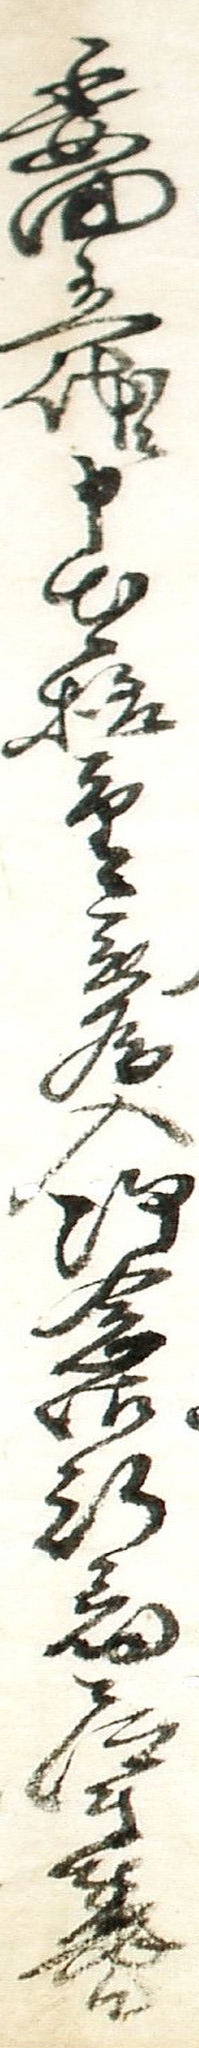委曲有体ニ申出候様重々被為入御念御行着被仰付奉畏候
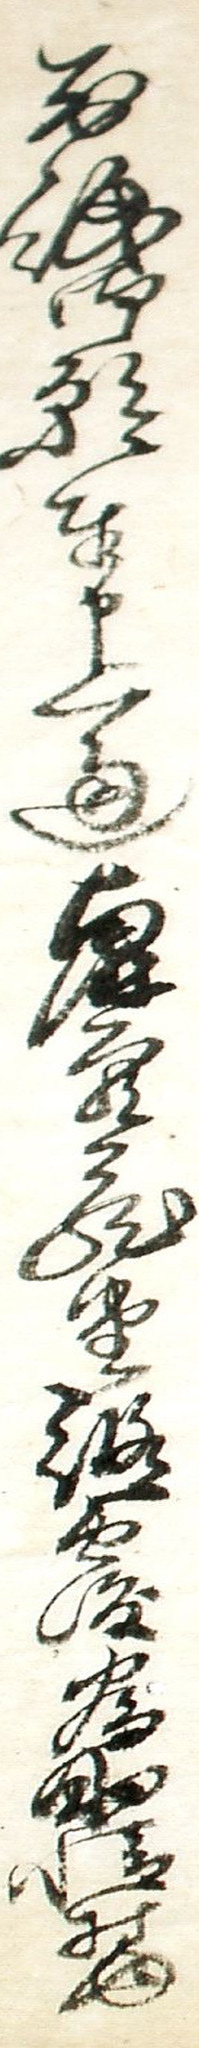別紙御願奉申上通虚空蔵堂修覆為助情村内
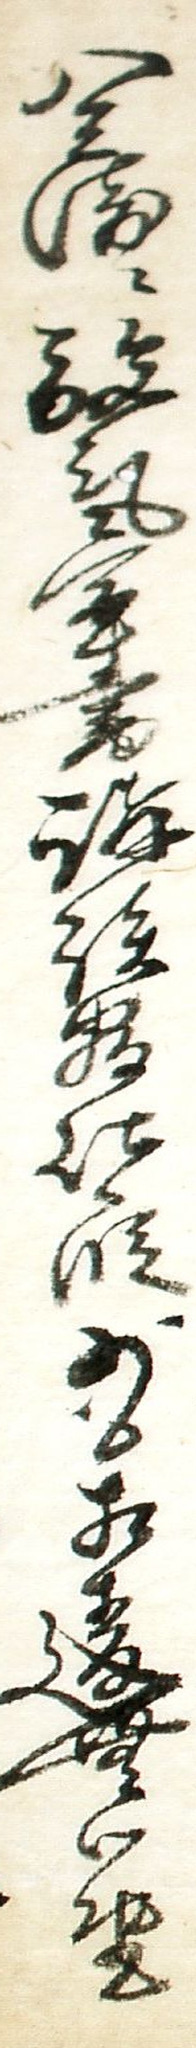八兵衛ニ駭気軍書講談為仕候段少も相違無御坐
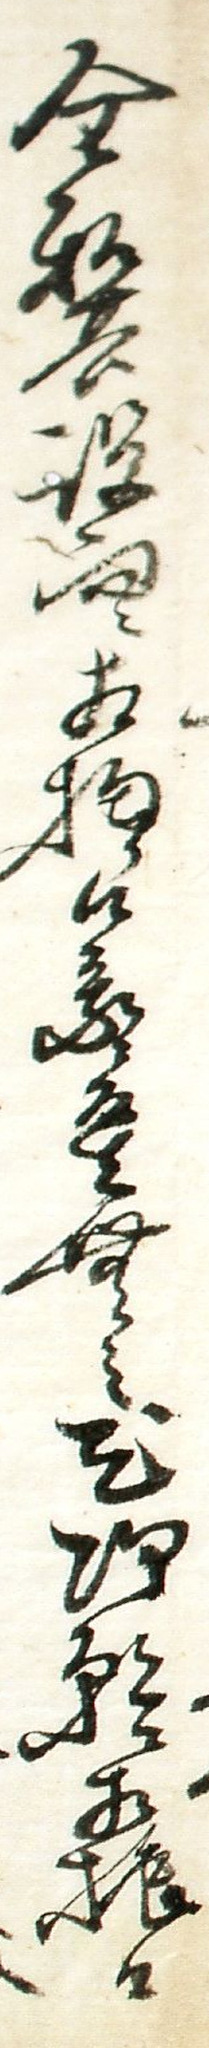全私共役向ニ相拘り候義ニ而者無之尤御願ニ相振候
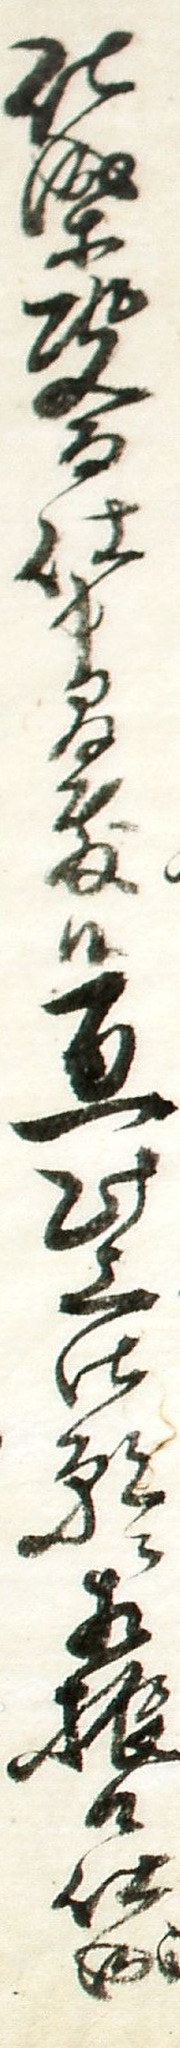仕成等決而仕申間敷候万一此上御願ニ相振候仕成
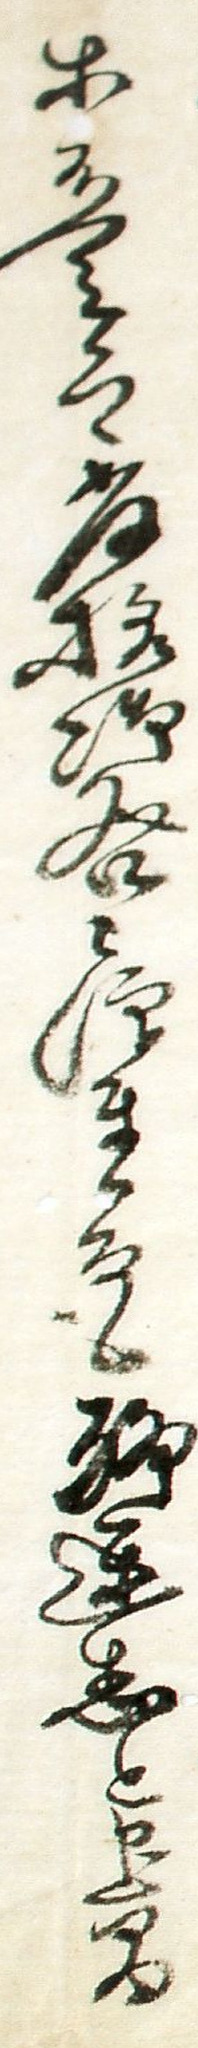等有之候ハヽ如何様御咎被仰付候而も聊迷惑と申上間
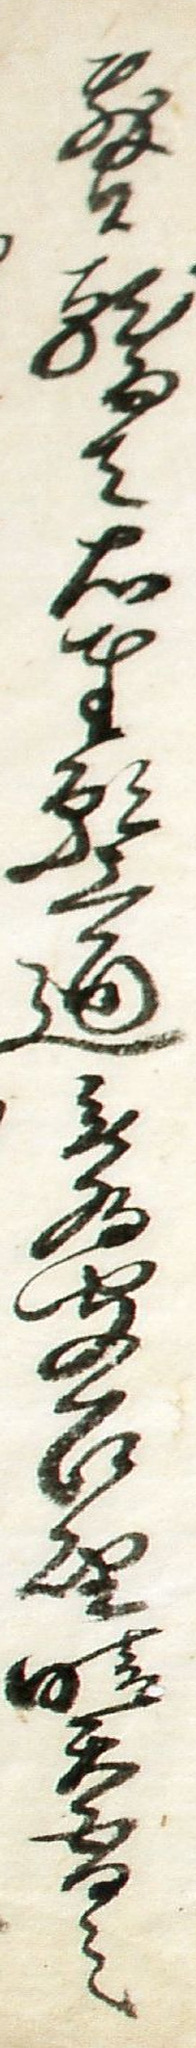敷候就而者右奉願上通被為聞召届晴天五日之
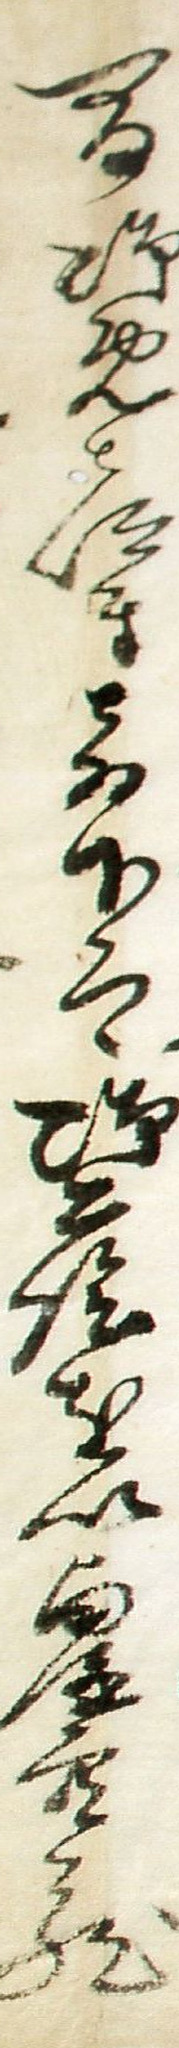間御免被仰付被為下候ハヽ御蔭を以虚空蔵
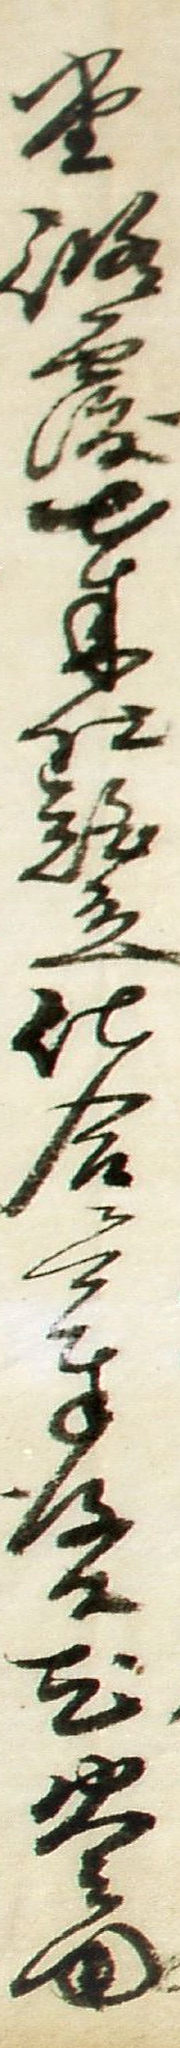堂修覆出来仕難有仕合ニ可奉存候尤火之用

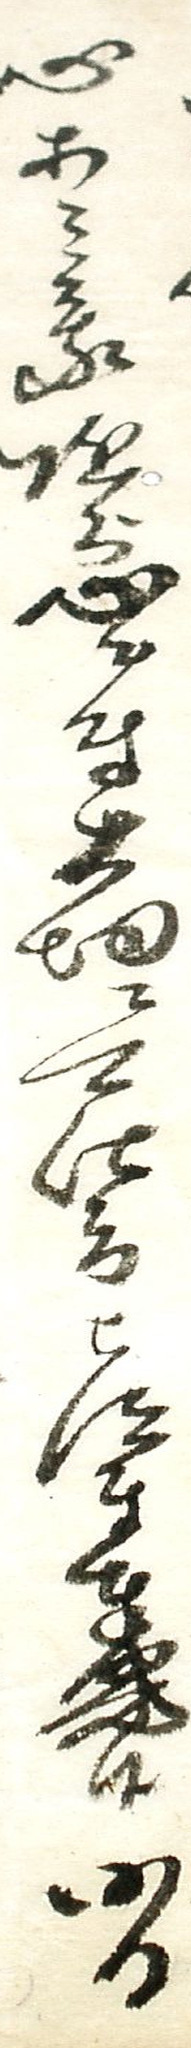心等之義随分心ヲ付大切ニ可仕旨被仰付奉畏候仍而
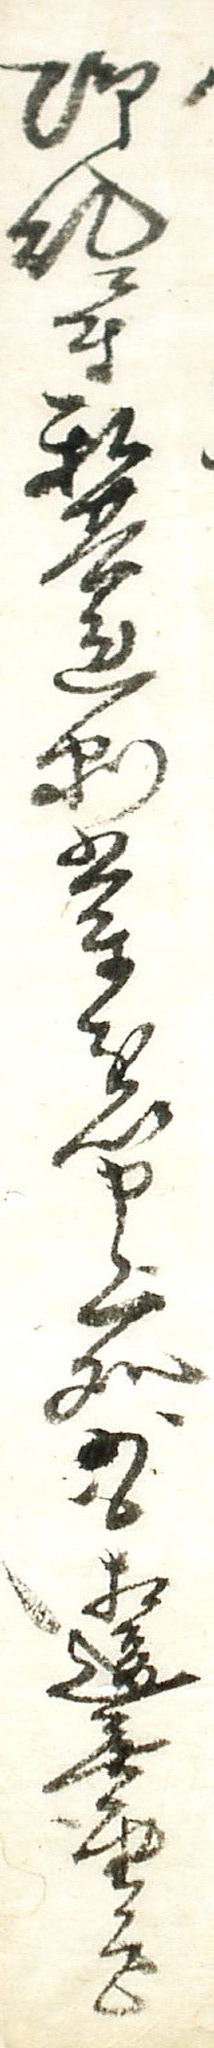御糺ニ付私共連判書付を以申上処少も相違無御坐候以上
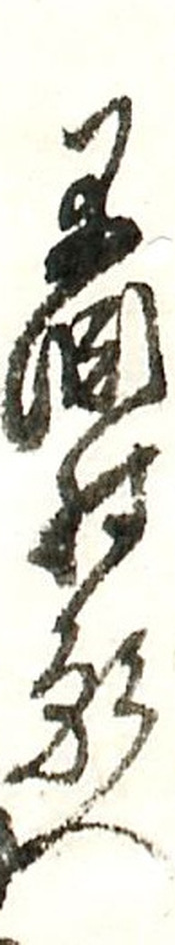早渕村願人
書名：(早渕村福満寺子ども浄瑠璃願紙面）他
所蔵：鳴門教育大学 Naruto University of Education
